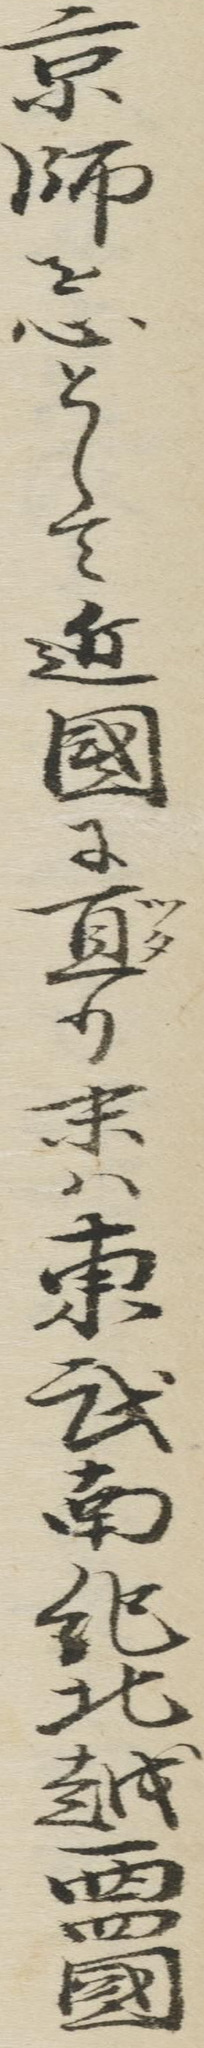京師を心として近国に亘り末ハ東武南紀北越西四国
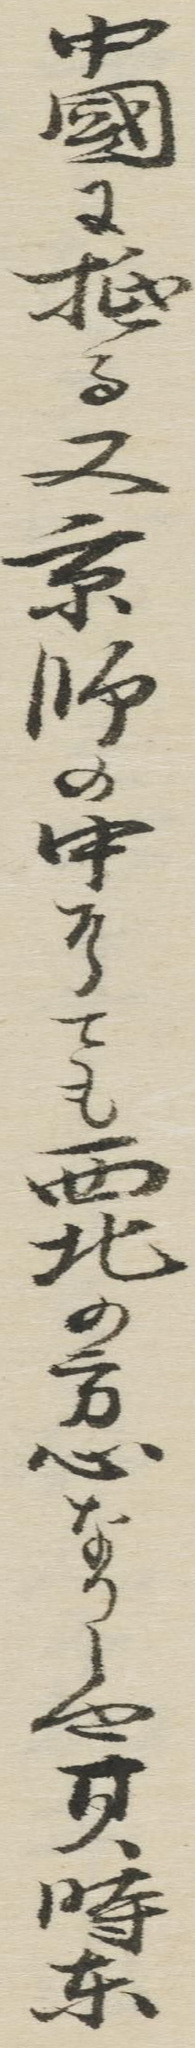中国に抵る又京師の中にても西北の方心なりし也其時東
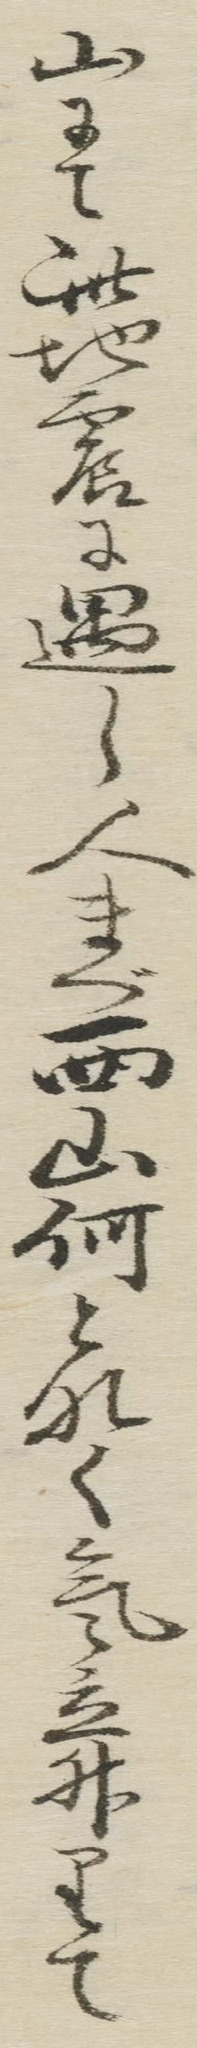山にて此地震に遇し人まづ西山何となく気立升りて
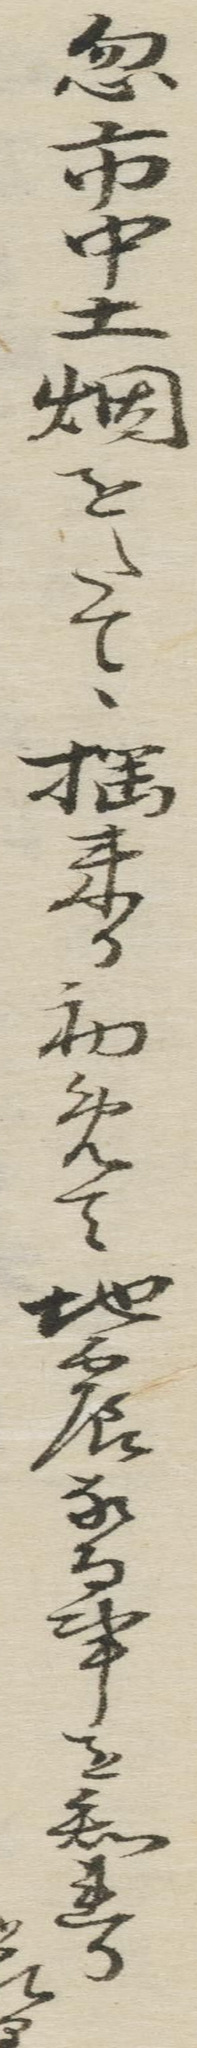忽市中土烟をたてゝ揺来り初めは地震なることを知れりとなり
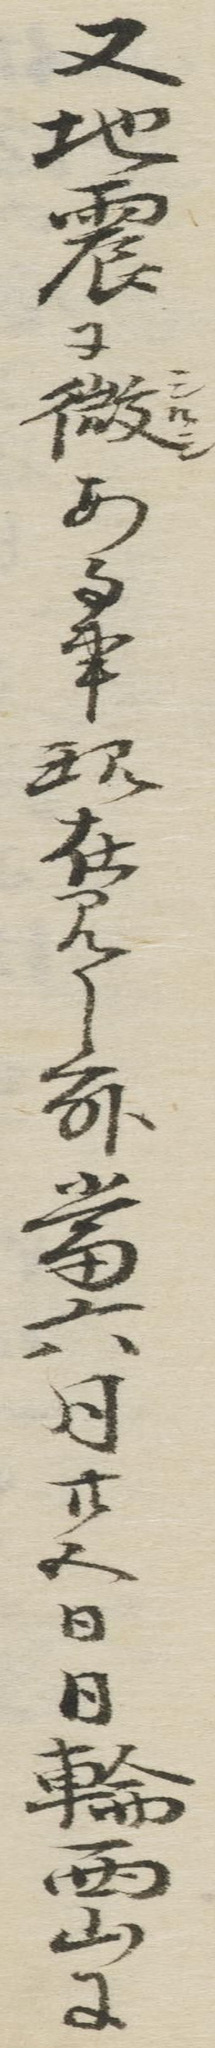亦地震に徴ある事現在見候所當六月二十五日日輪西山に
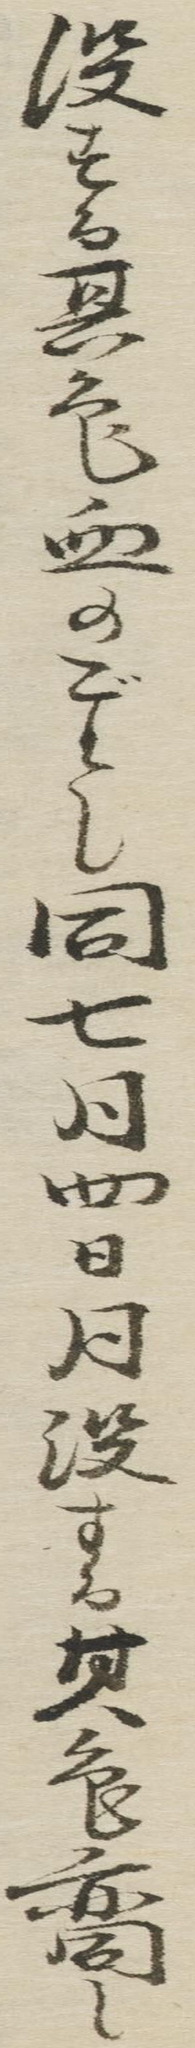没する其色血のごとし動七月四日月没する其色亦同じ
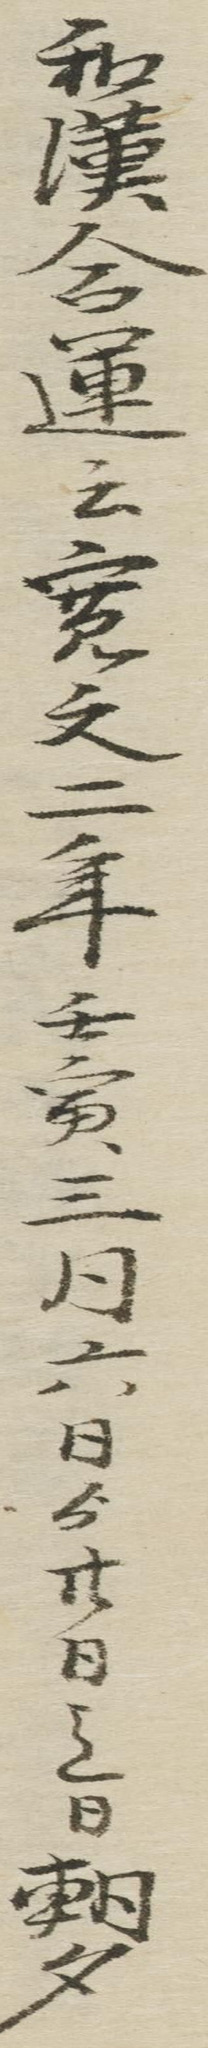和漢合運云寛文二年壬寅三月六日ゟ廿日迄日朝夕

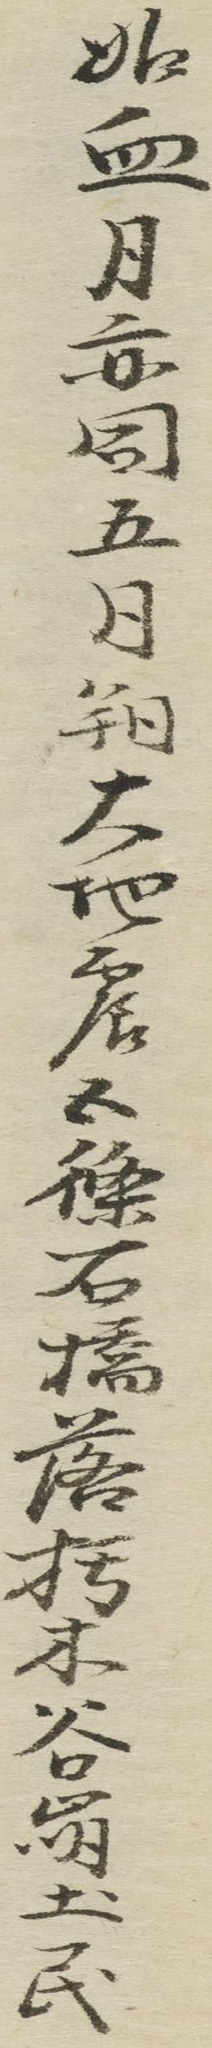始ノ四月亦同五月朔大地震五条石橋落朽木谷崩土民
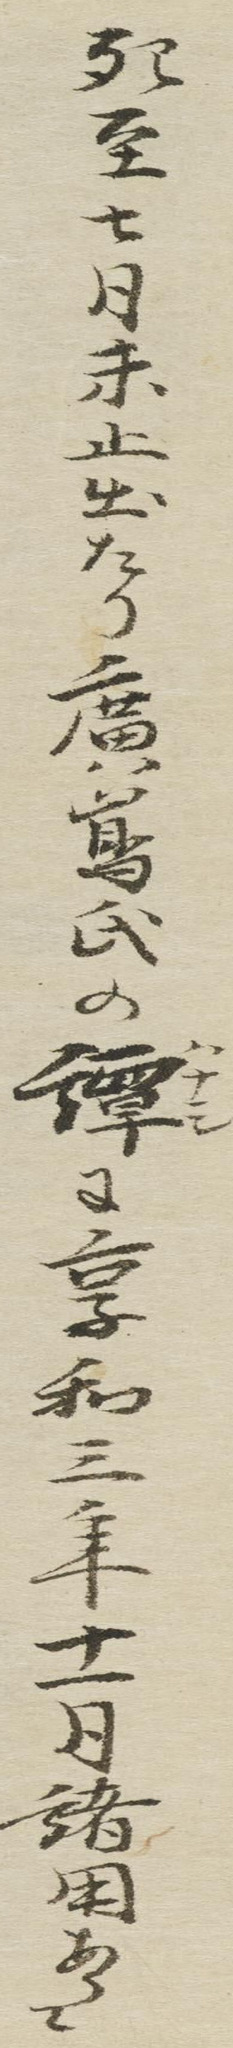死至七月末止出たり広嶌氏の譚に享和三年十一月諸用ありて
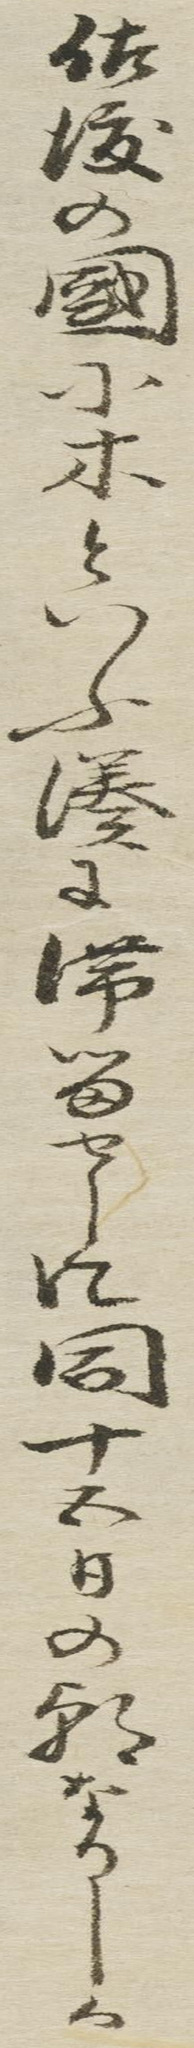佐渡の国小木といふ湊に滞留セしに同十五日の朝なりしが
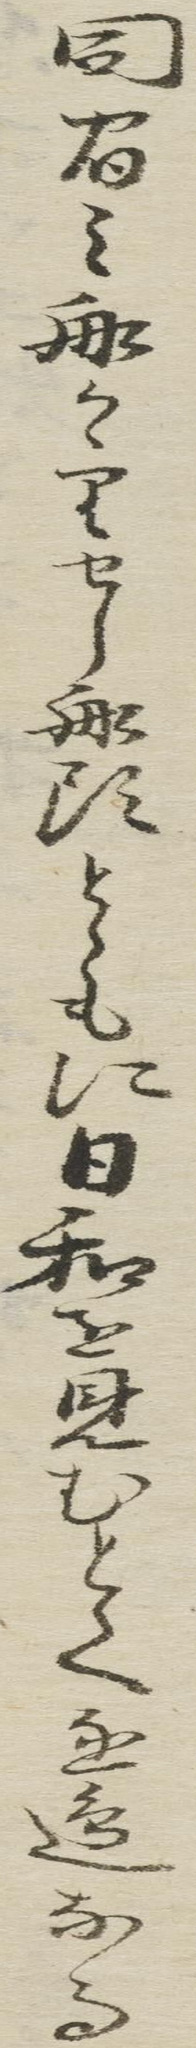同宿之船かがりせし船頭とともに日和を見むとて通辺なる
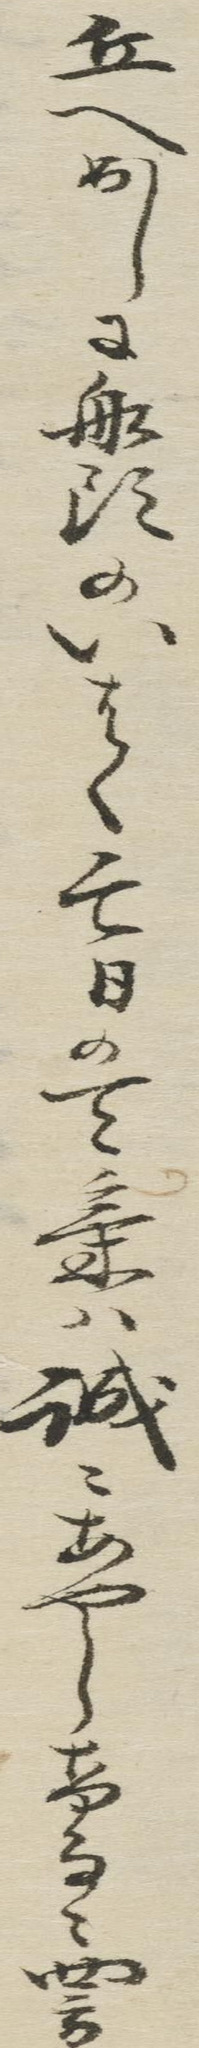丘へ出候に船頭のいはく亡日の天気ハ誠ニあやしけるニ四方
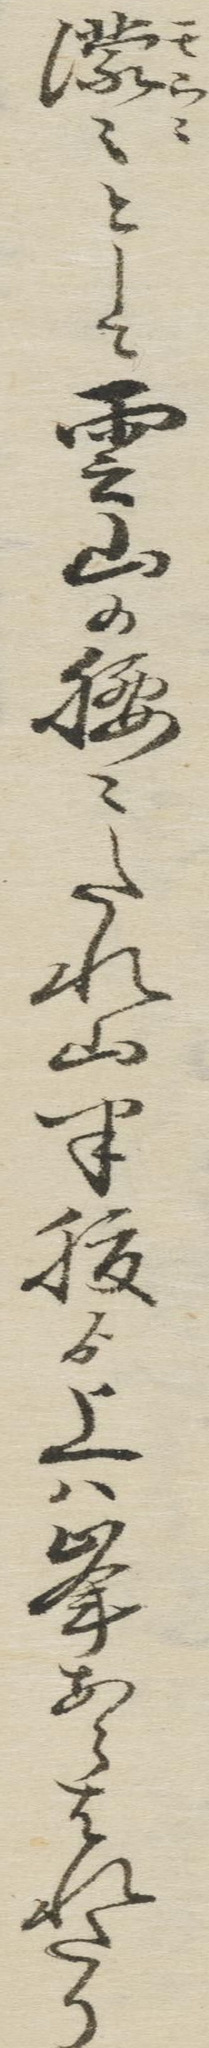濛々として雲山の腰ニたれ山半腹ゟ上ハ峯あらはれたり
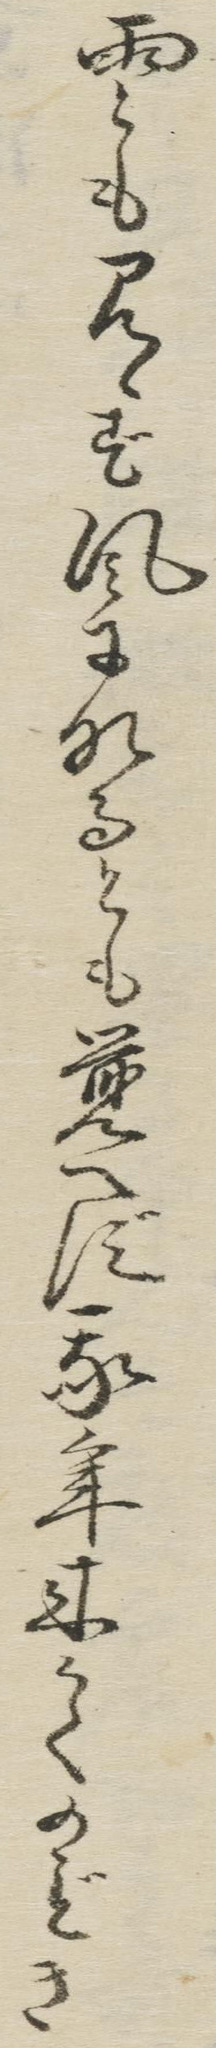雨とも見えず風になるとも覚えず我年来かくのごとき
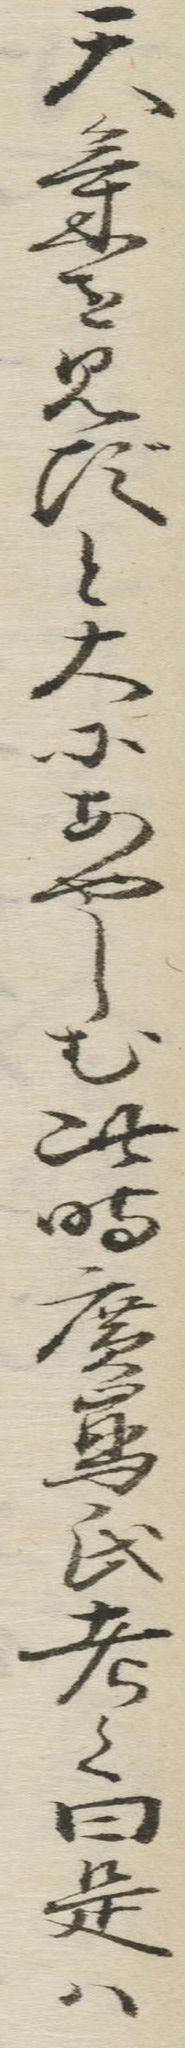天気を見ずと大にあやしむ此時広嶌氏考て曰是ハ
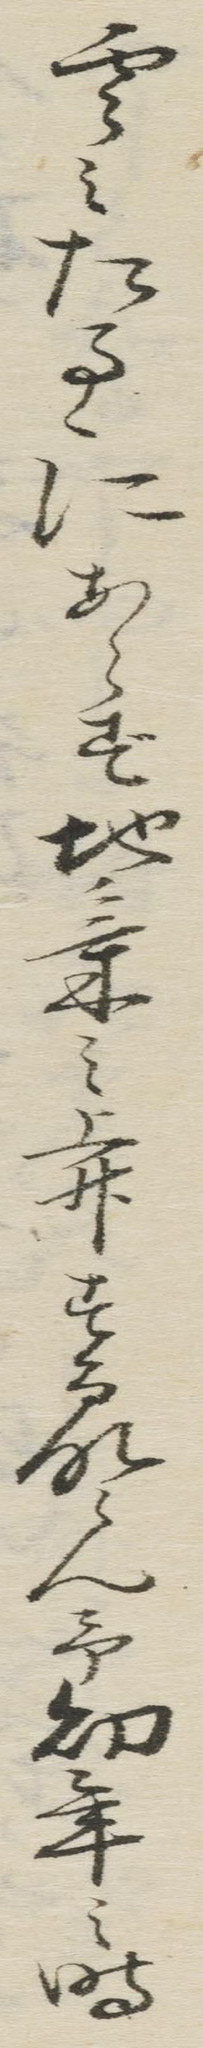雲ミたるにあらず地ニ気之上升するならん予幼年之時
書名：諸国大地震大津波一代記
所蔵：東京大学地震研究所図書室 Earthquake Research Institute Library, The University of Tokyo, JAPAN
